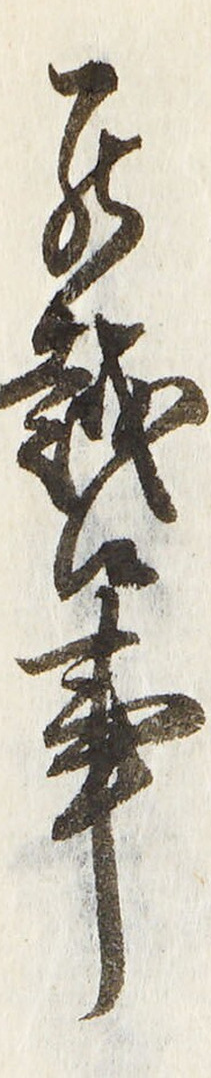罷越候事
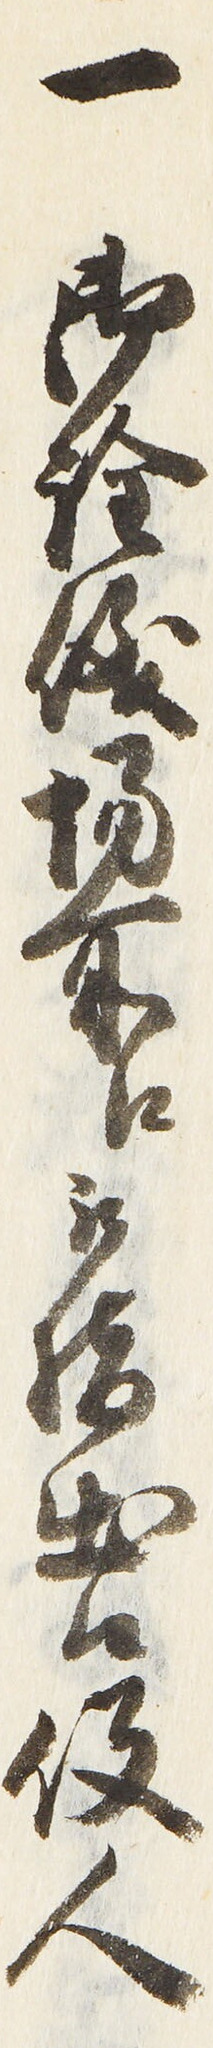一御詮儀場所江被指出候役人
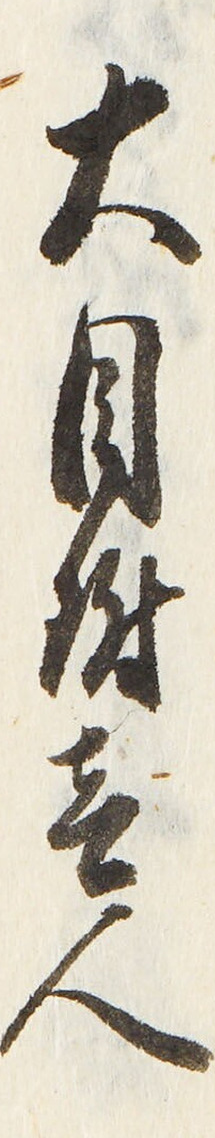大目付壱人
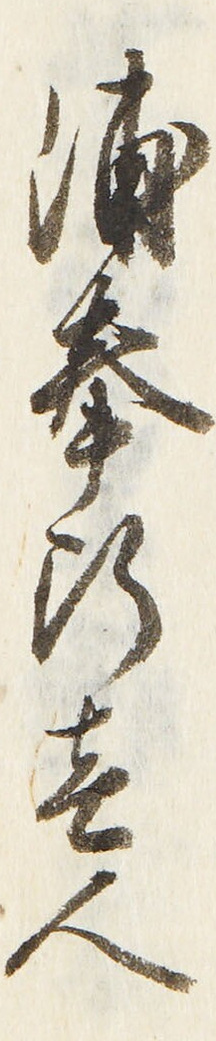浦奉行壱人
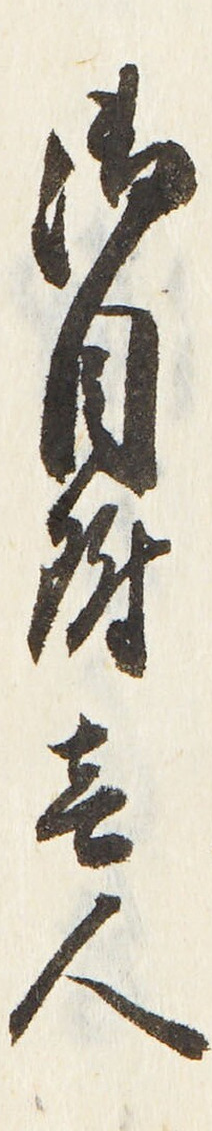御目付壱人
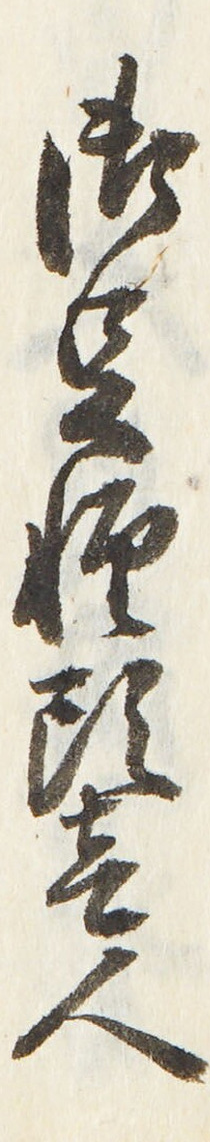御足軽頭壱人
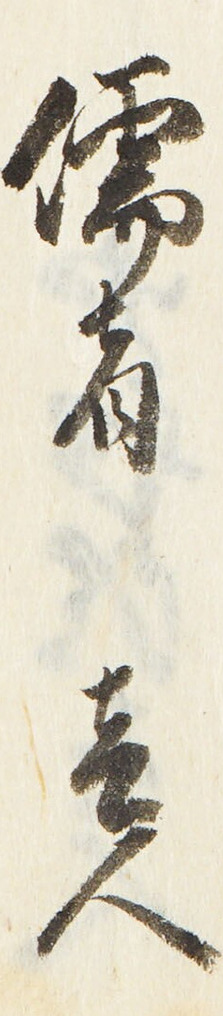儒者壱人
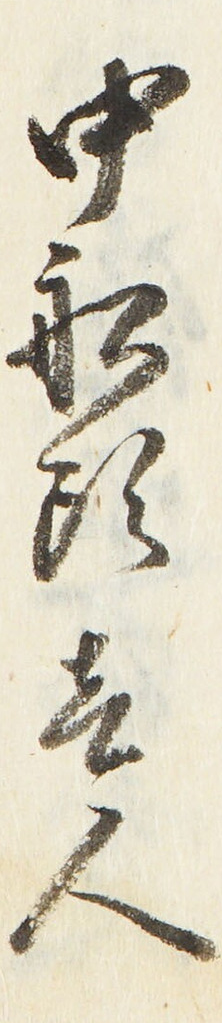中船頭壱人

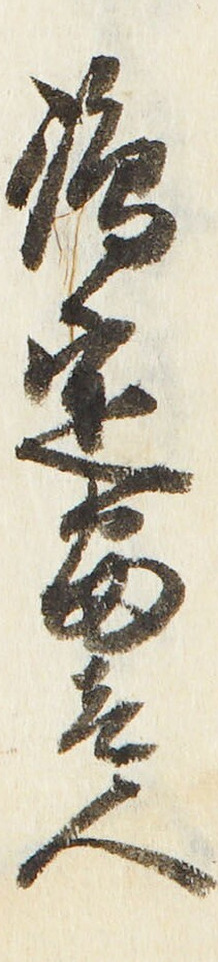嶋定番壱人
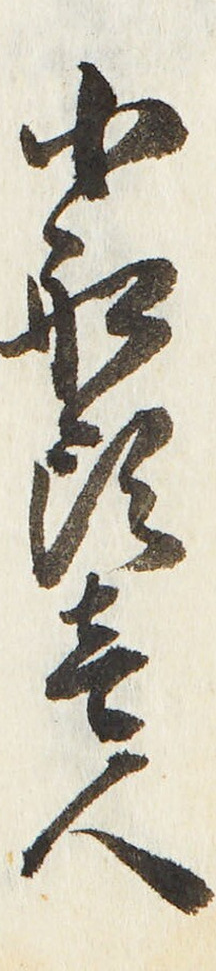小船頭壱人
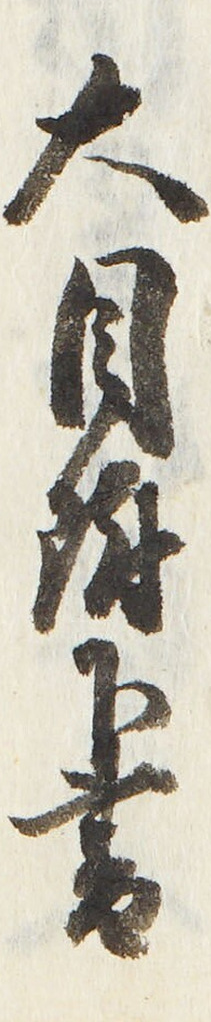大目付下番
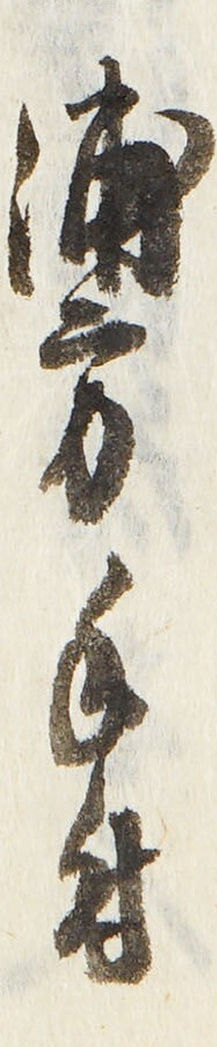浦方手付
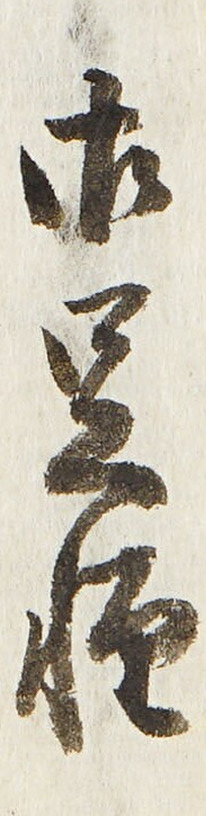御足軽
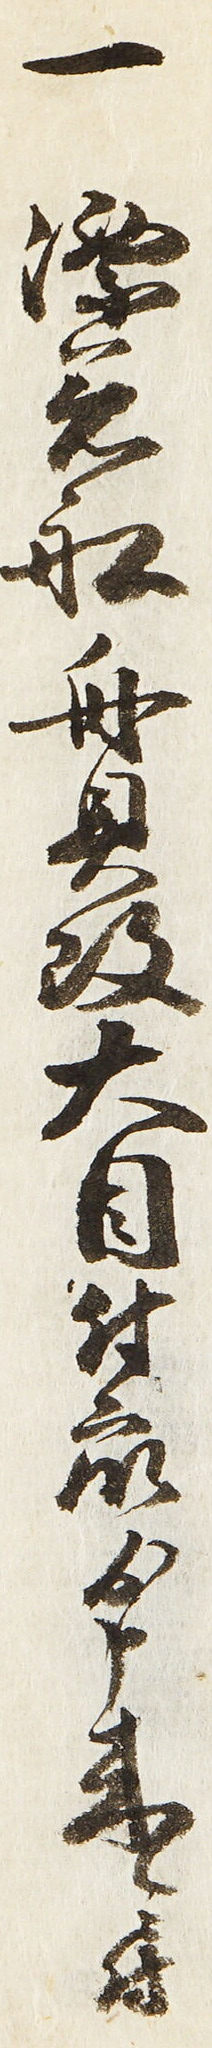一漂着船舟具改大目付衆ゟ申来候ニ付
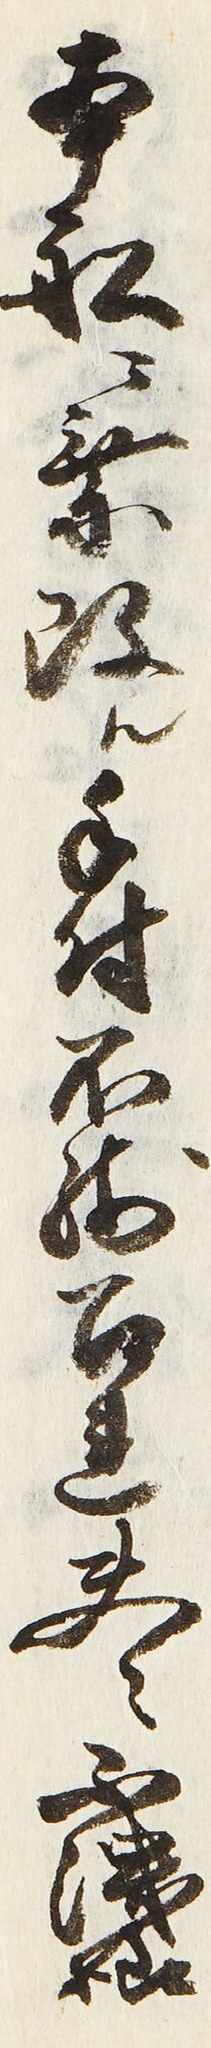船ニ乗改ル手付不残召連夫々不洩様
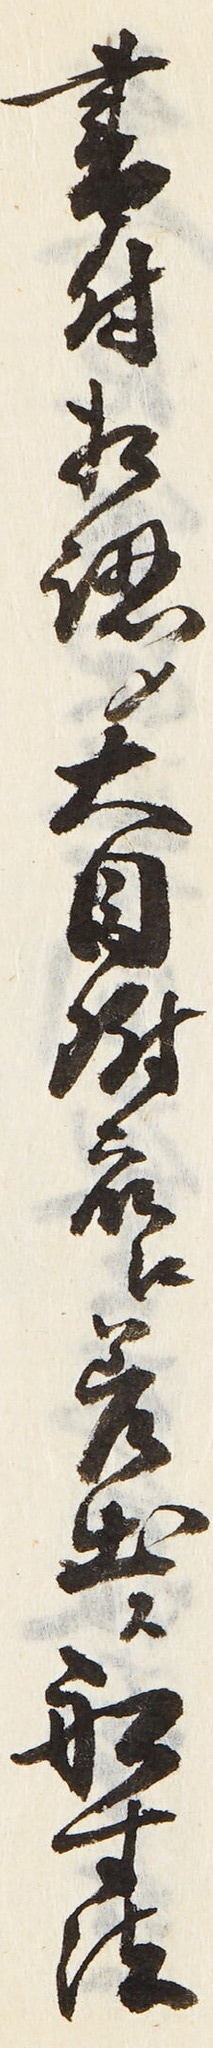書付相認メ大目付衆江差出ス船寸法
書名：玄海嶋江漂着船為警固長崎江被越候覚
